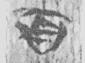百
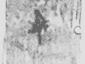十
